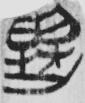○（與）
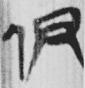伊
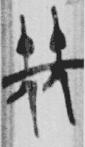堯
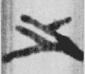之
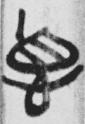惪（德）
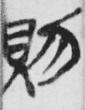則（則）
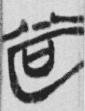甚
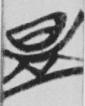盟（明）
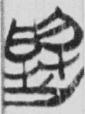○（與）
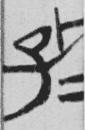孔子
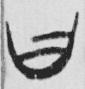曰
